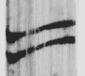二
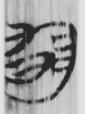旬
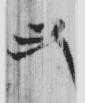又
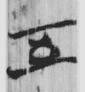五
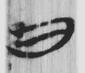日
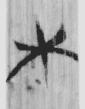木
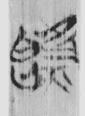{既火}
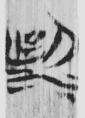渴
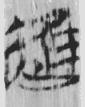進
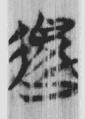退
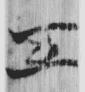五
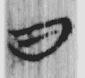日
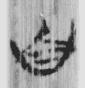自
